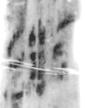○（亡）
